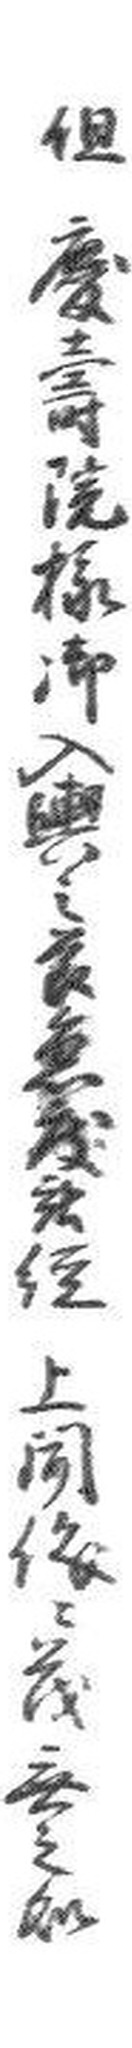但慶寿院様御入輿之節急度被経上聞儀ニも無之処
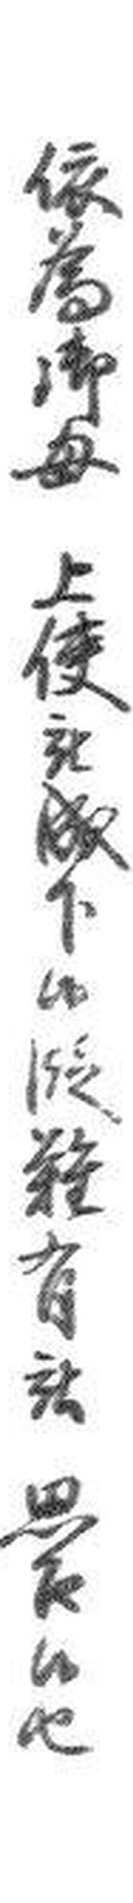依為御母上使被成下候段難有被思召候由
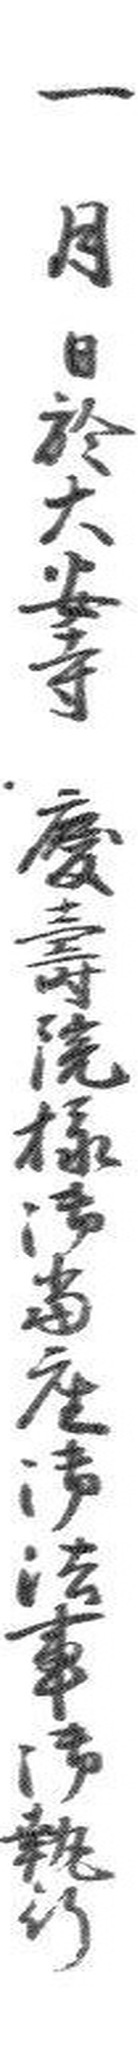一月日於大安寺慶寿院様御当座御法事御執行
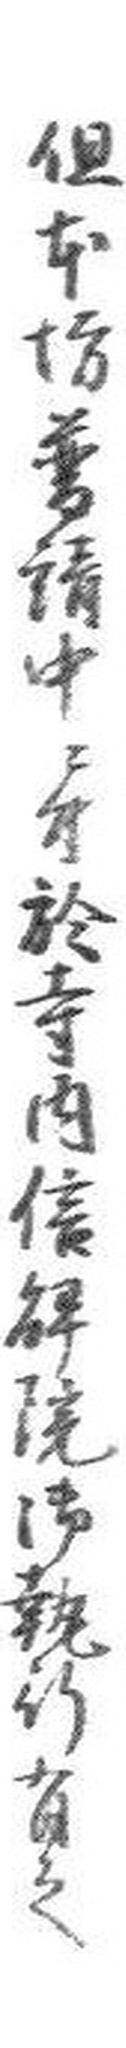但本坊普請中ニ付於寺内信解院御執行有之
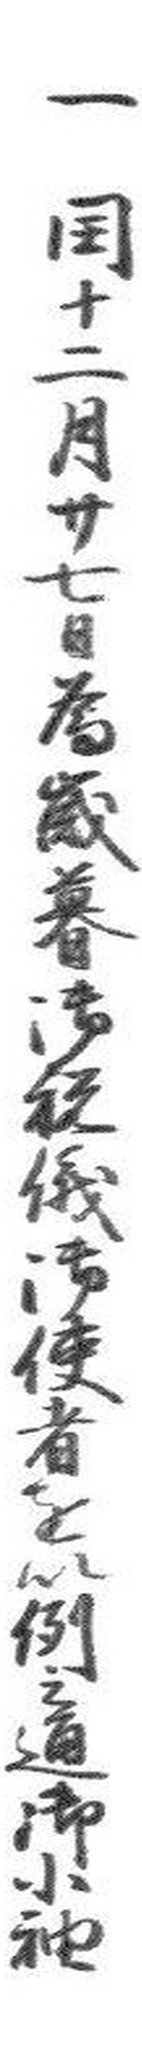一閏十二月廿七日為歳暮御祝儀御使者を以例之通御小袖
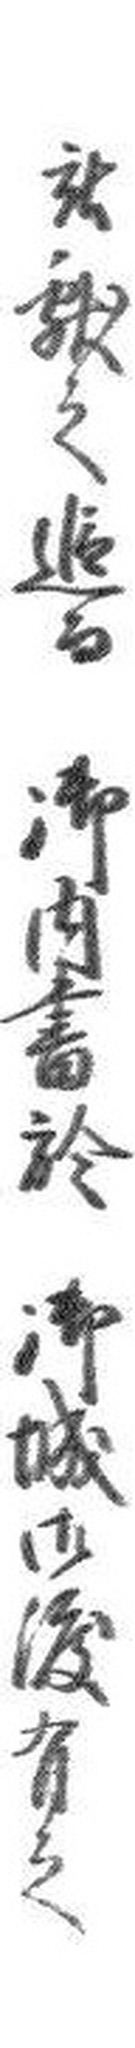被献之追而御内書於御城御渡有之

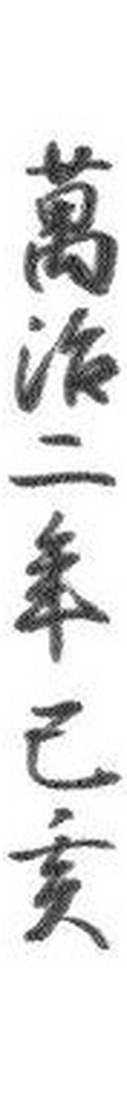万治二年己亥
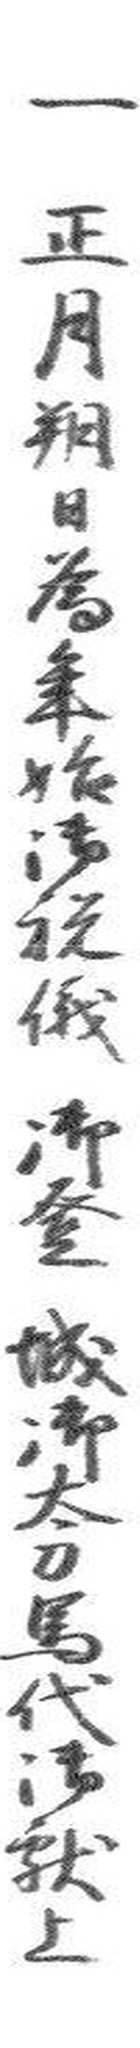一正月朔日為年始御祝儀御登城御太刀馬代御献上
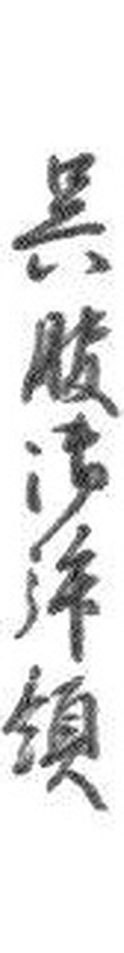呉服御拝領
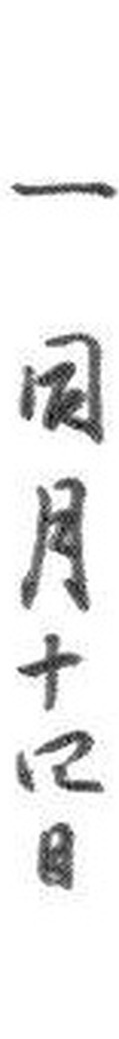一同月十四日
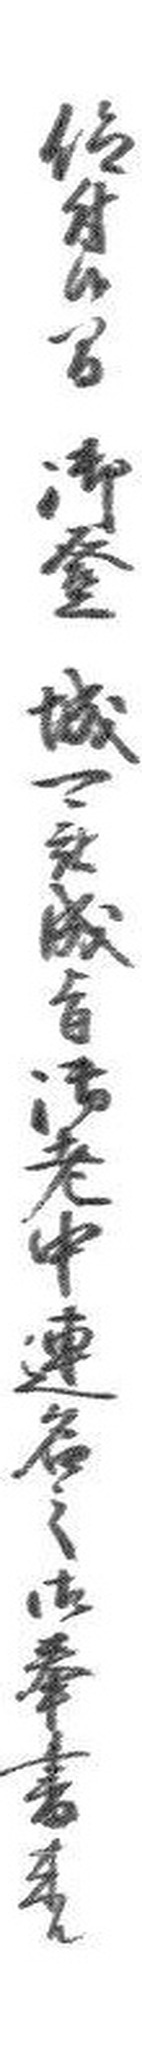仰付候間御登城可被成旨御老中連名之御奉書来ル
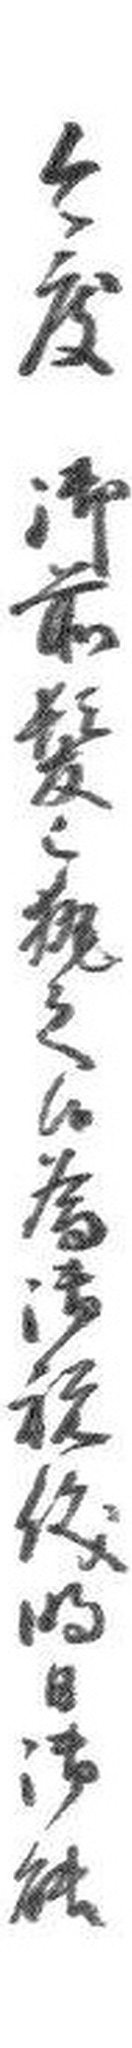今度御前髪被執之候為御祝儀明日御能
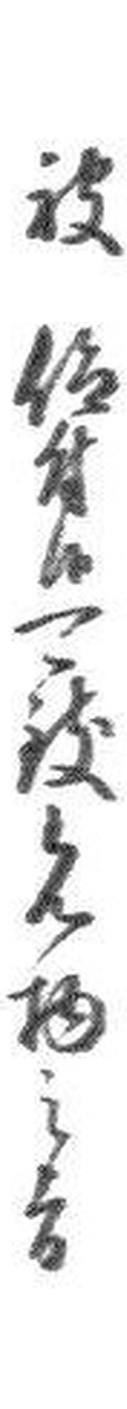被仰付候可致見物之旨

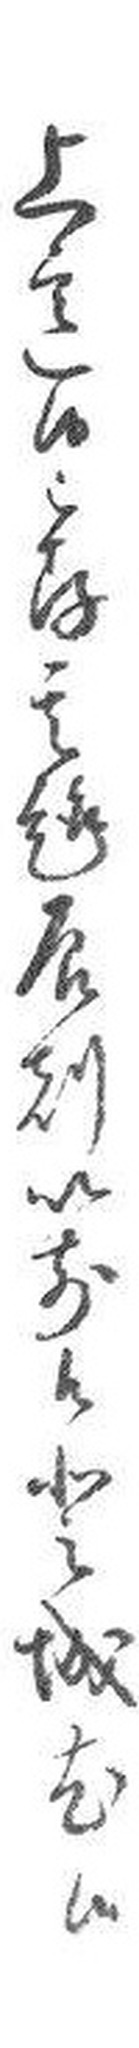上意候被存其趣辰刻以前被登城尤候
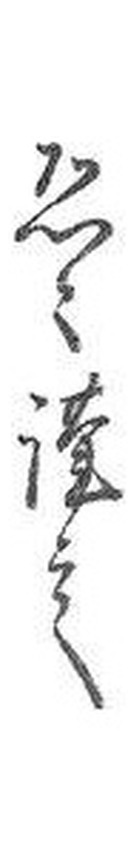恐々謹言
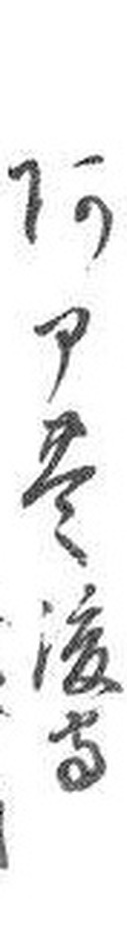阿部豊後守
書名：家譜 五 光通公 従寛永十三年到万治二年
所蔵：福井県文書館 Fukui Prefectural Archives
